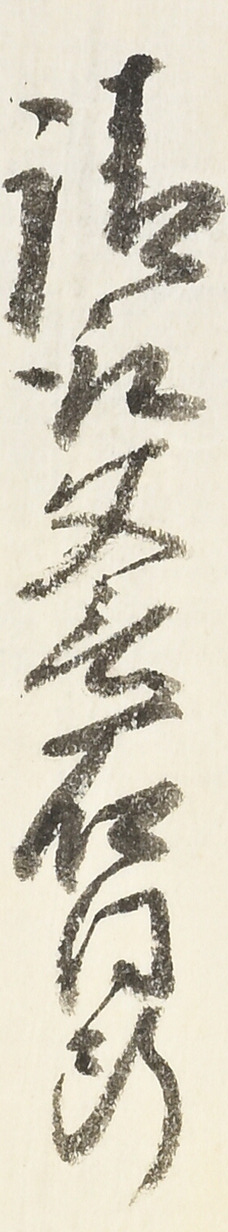請取文言右同断
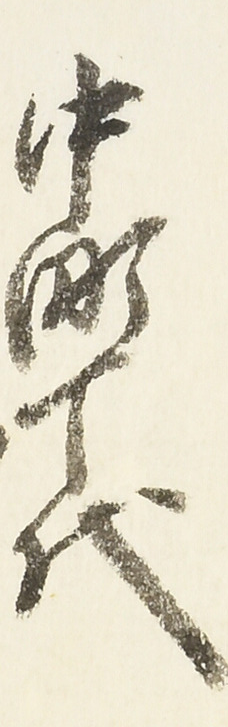中町丁代
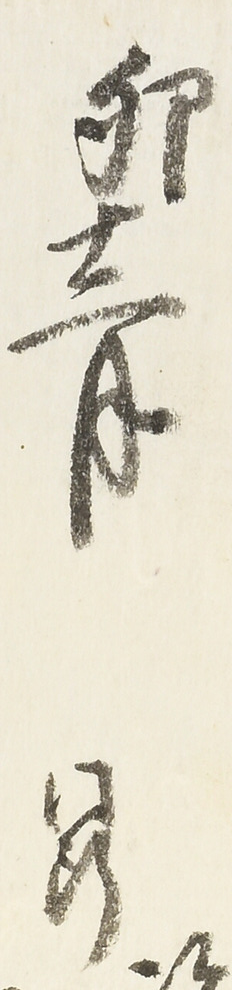卯十二月同断
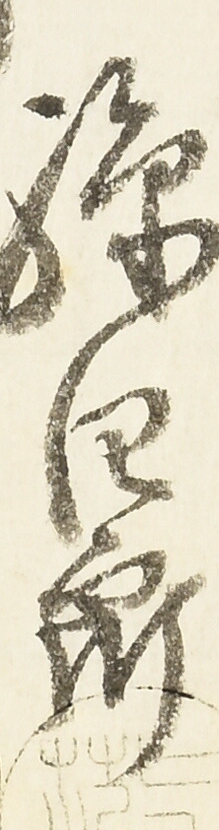源四郎
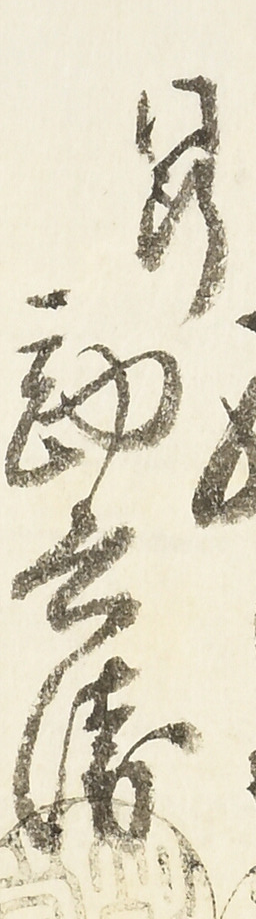勘兵衛
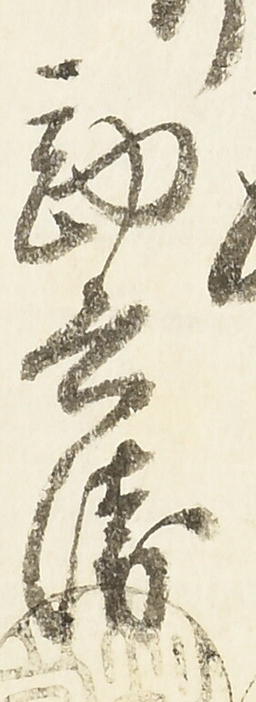勘兵衛
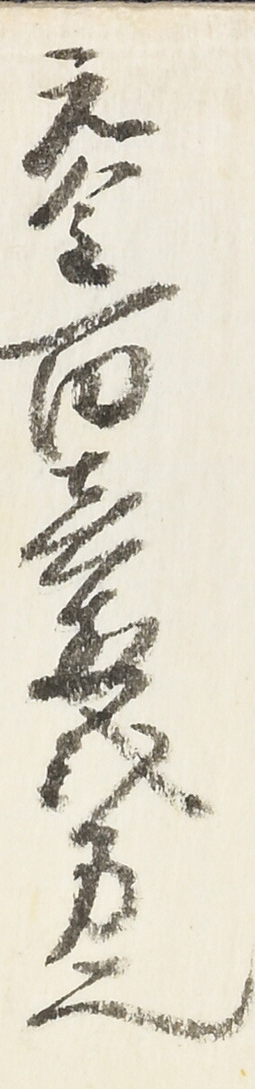元金百壱両弐分也
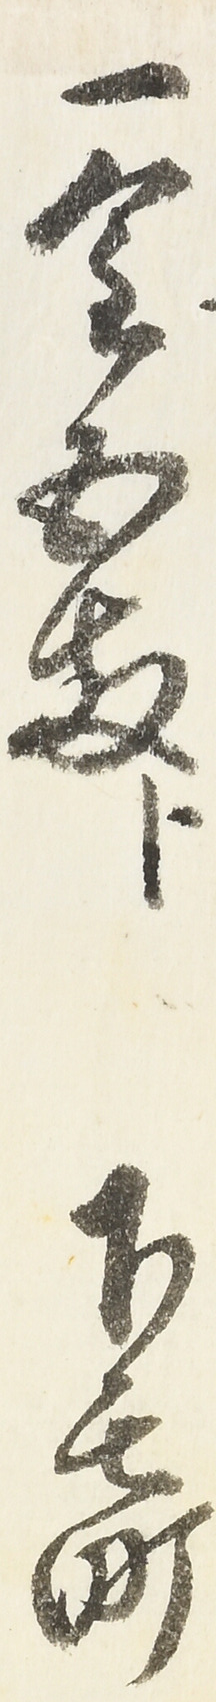一金五両ト下モ町
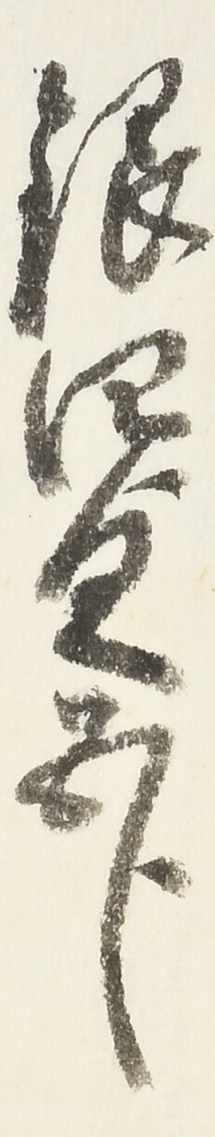銀四匁五分

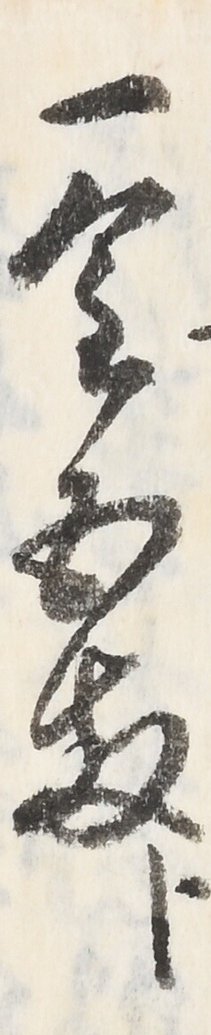〆金五両ト
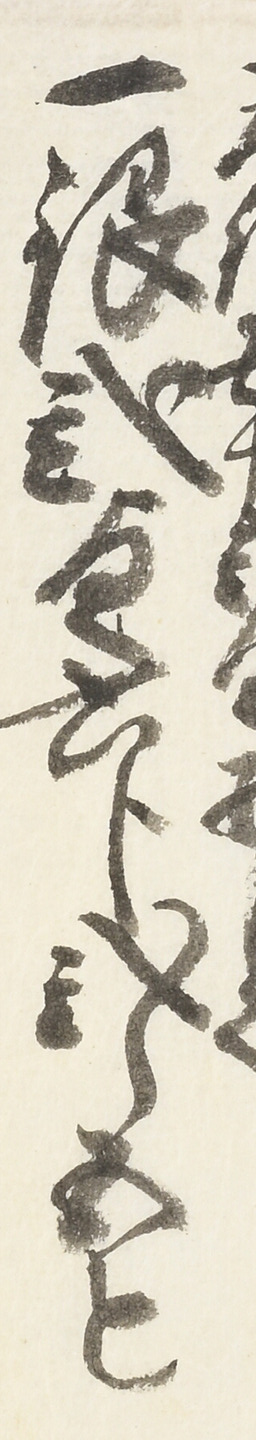一銀弐匁六分弐厘五毛
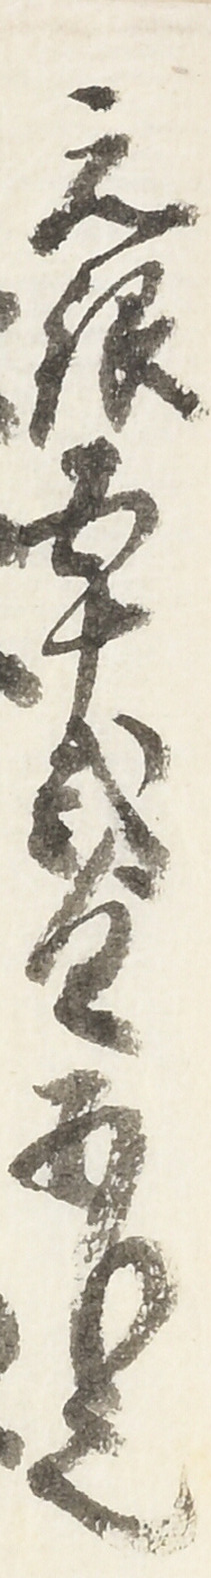元銀五十弐匁五分也
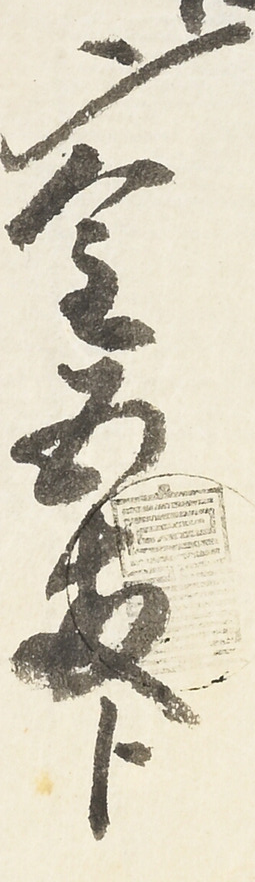〆金五両ト
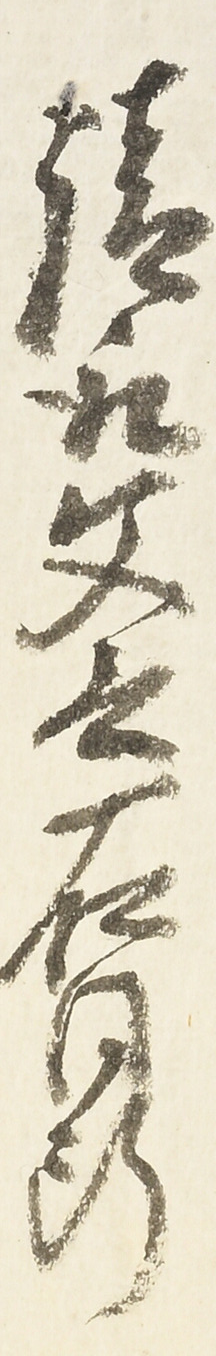請取文言右同断
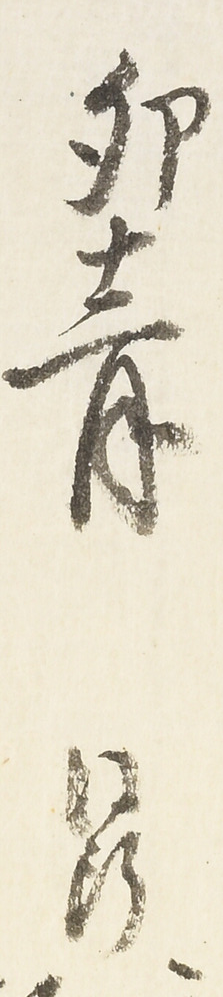卯十二月同断
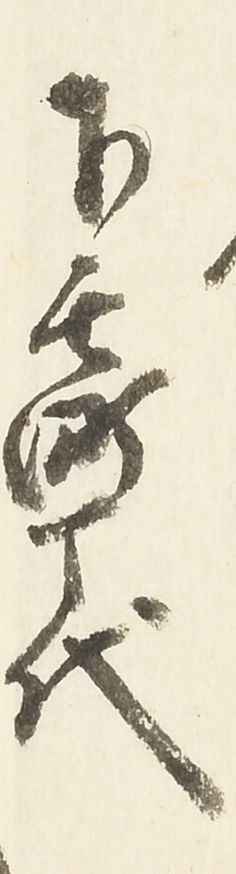下モ町丁代
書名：御才覚金御利足割渡扣帳
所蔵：伊那市立高遠町図書館・合同会社AMANE
